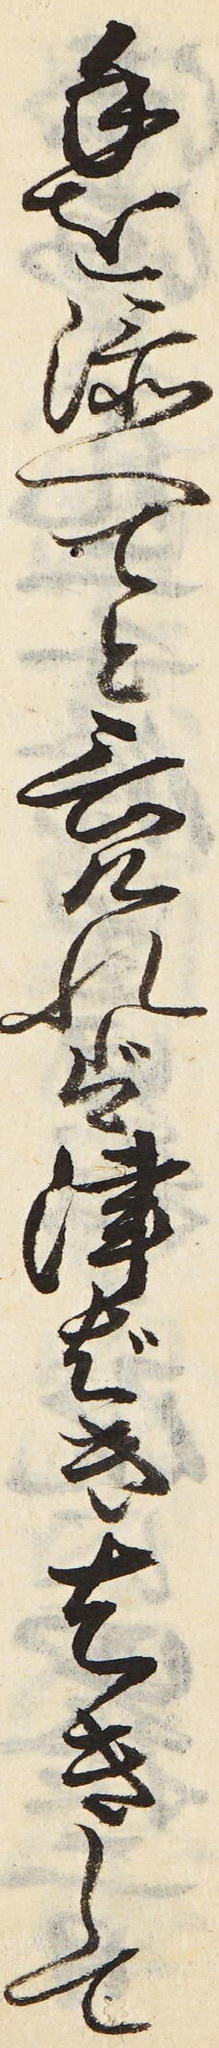手を添へてと云ければつばきはきして
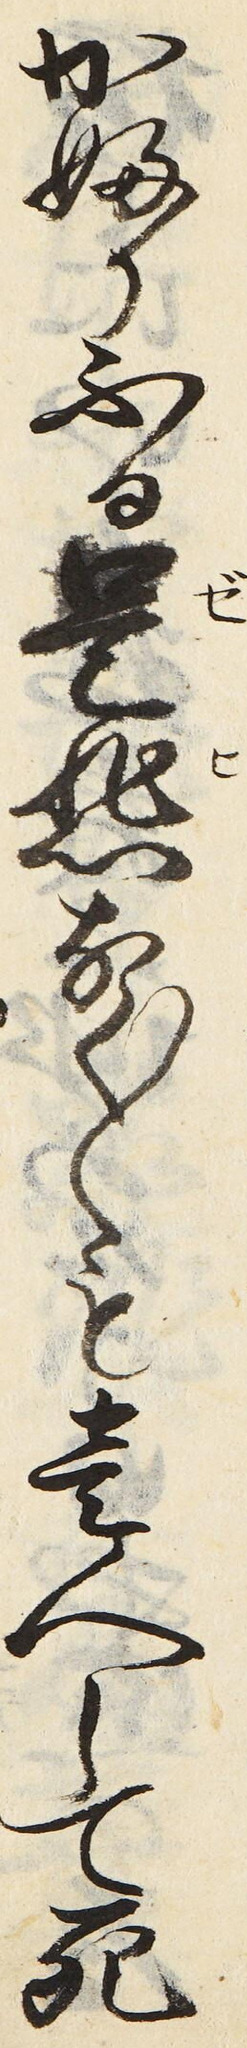かふりふる是悲なく〳〵も壱人して死
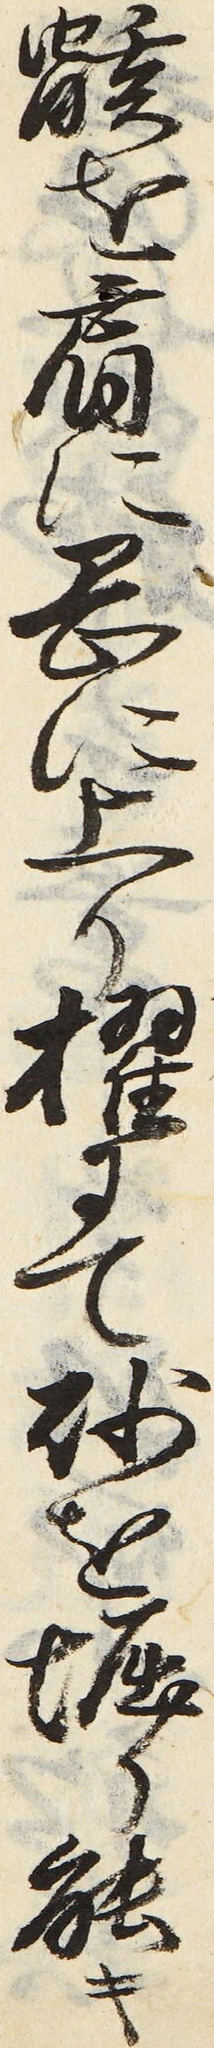骸を肩に岡に上り櫂にて砂を堀り能き
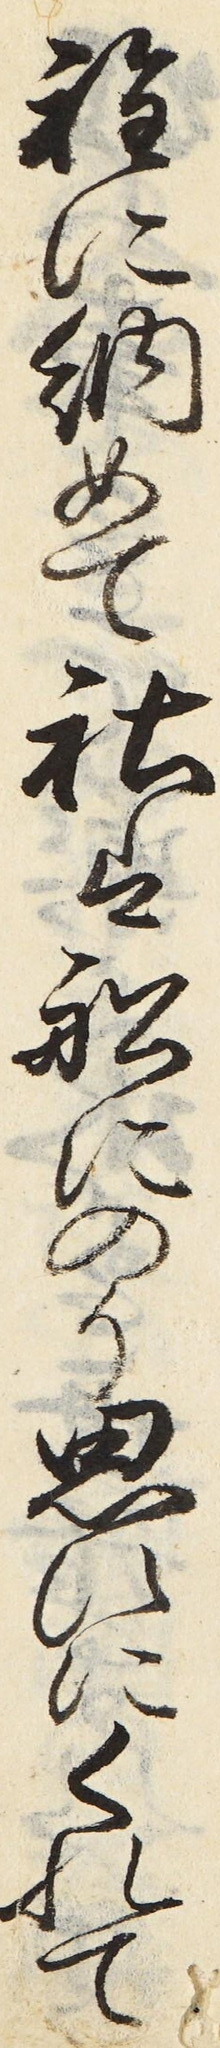程に納めては船にのり思ひにくれて
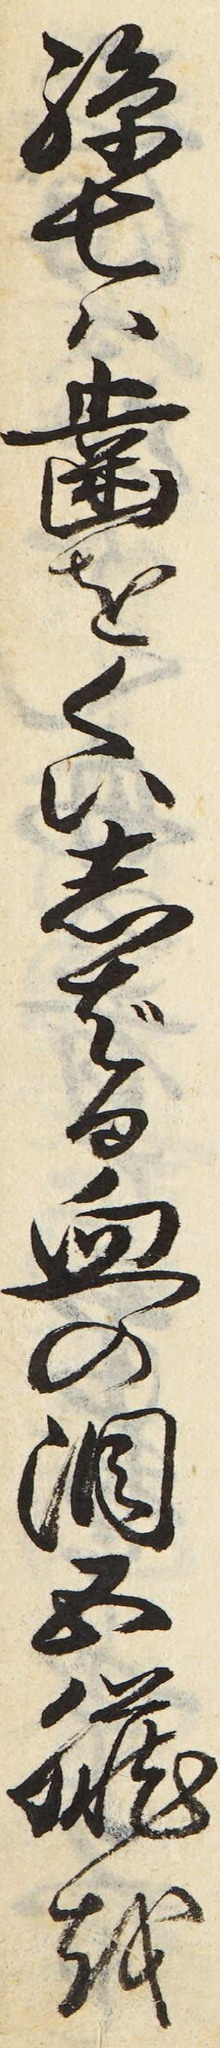孫七は歯をくいしばる血の泪五臓を

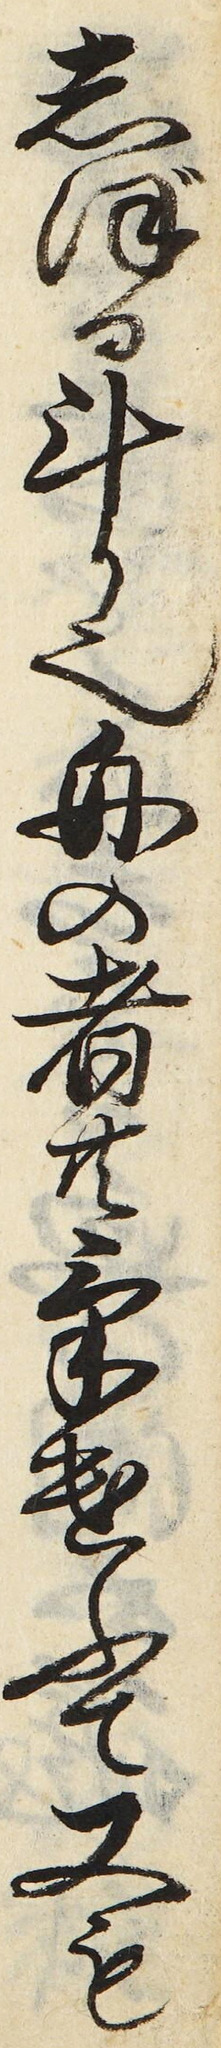しほる計り也舟の者共気遣ふて又も
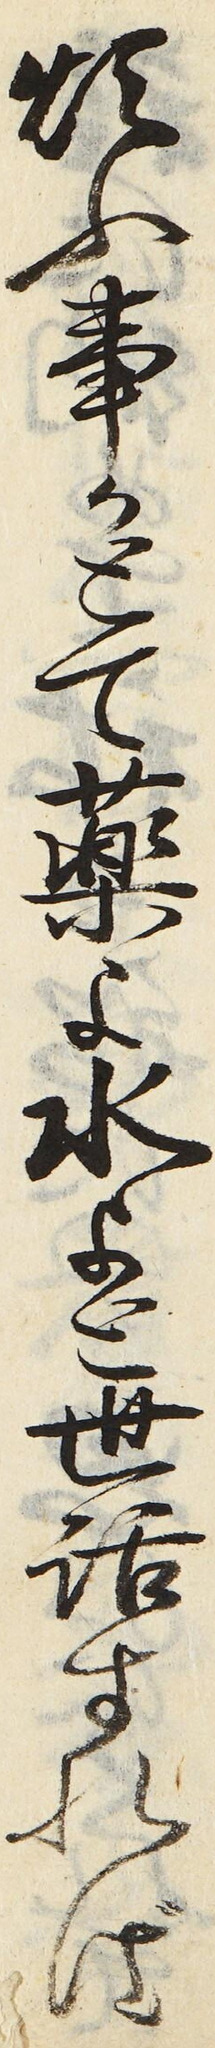煩ふ事かとて薬よ水よと世話すれば
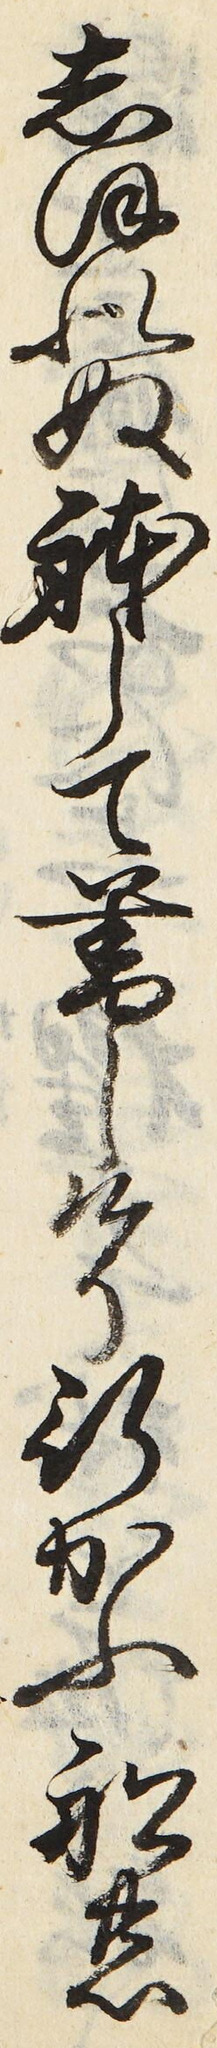しほれぬ躰して暮しけり行かふ船の
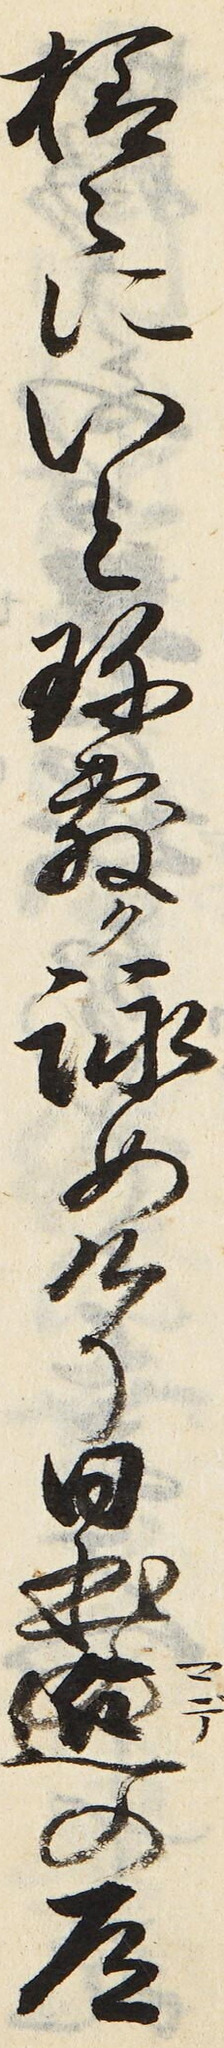様々にいと珎敷く詠めけり日本迠の道
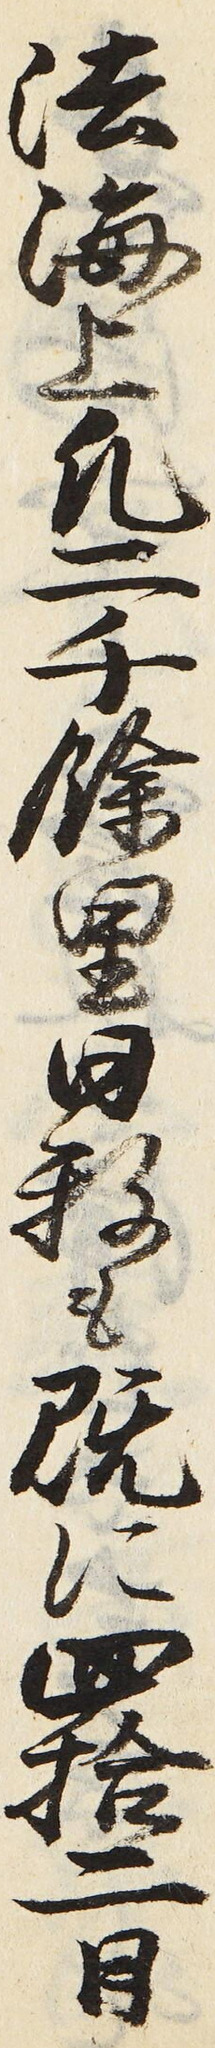法海上凡二千余里日数も既に四拾二月
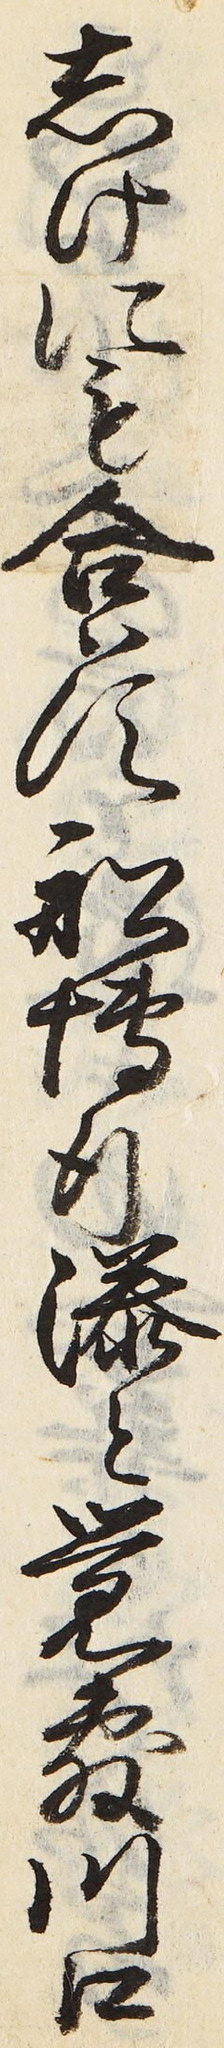しけにも合はす船博行湊と覚敷川口
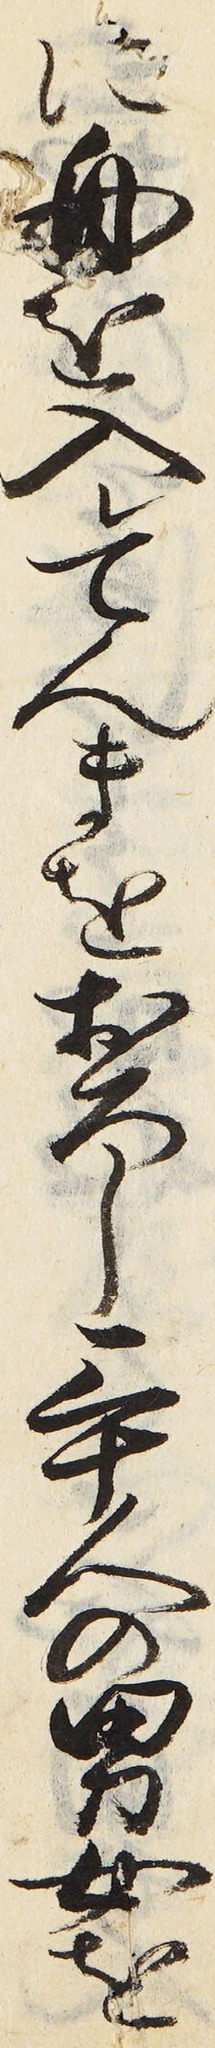に舟を入れてんまをおろし三十人の男女を
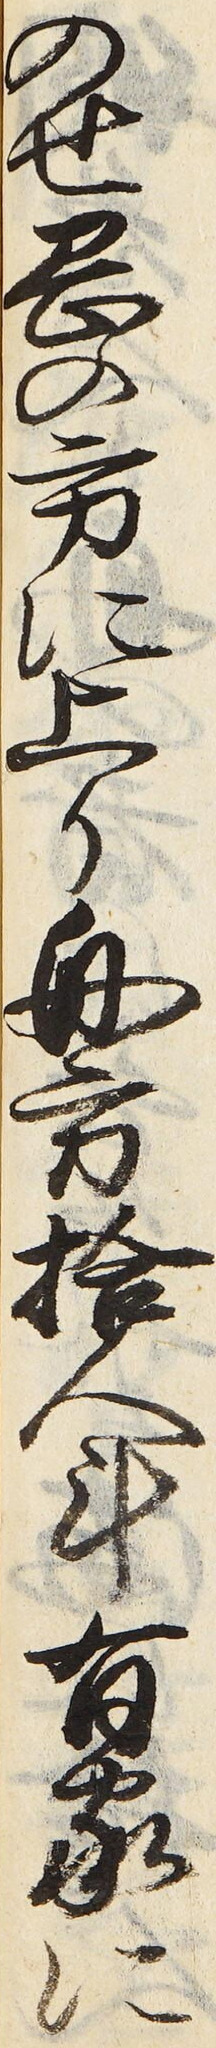のせ岡の方に上り舟方拾人計有家に
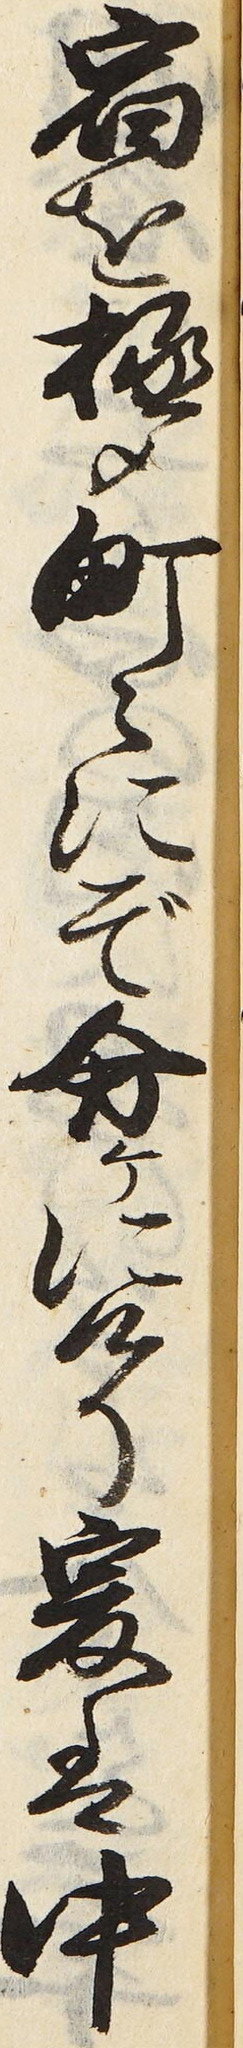宿を極め町々にぞ分けにけり爰は中
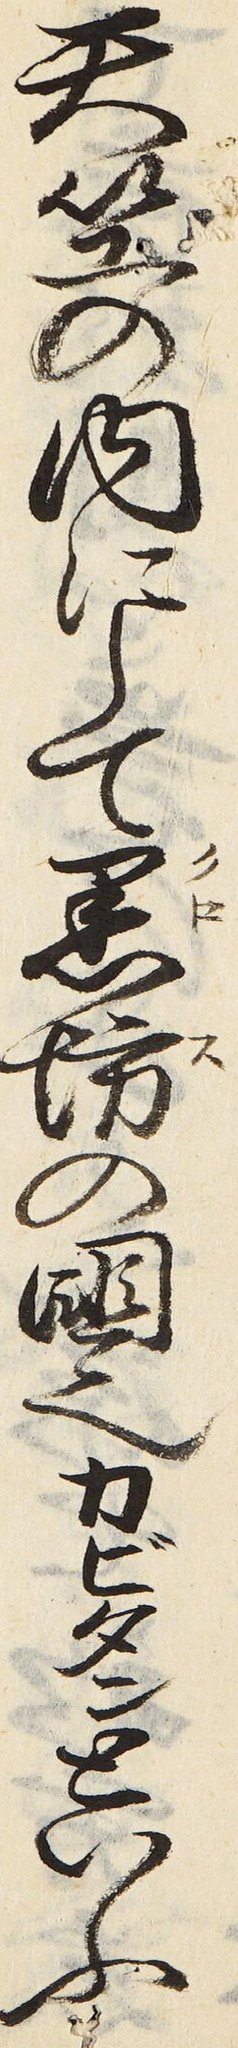天竺の内にして黒坊の国也カビタンといふ
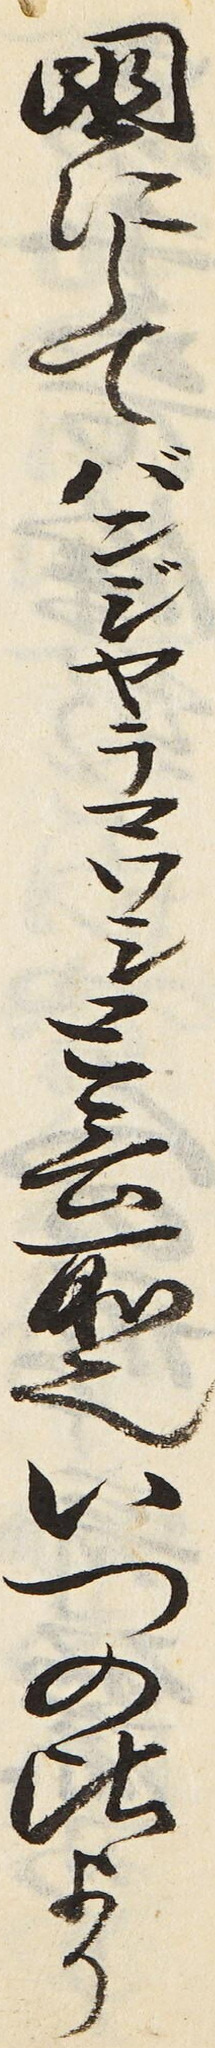国にしてパンジヤラマワシと云所也いつの頃より
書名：華夷九年録
